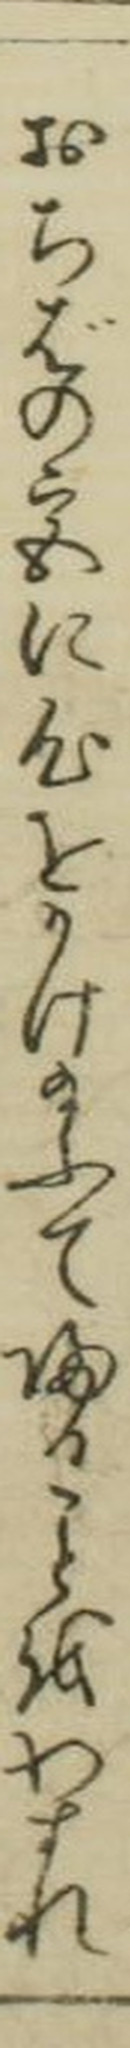おちばの宮に心をかけ給ふてふることをわすれ
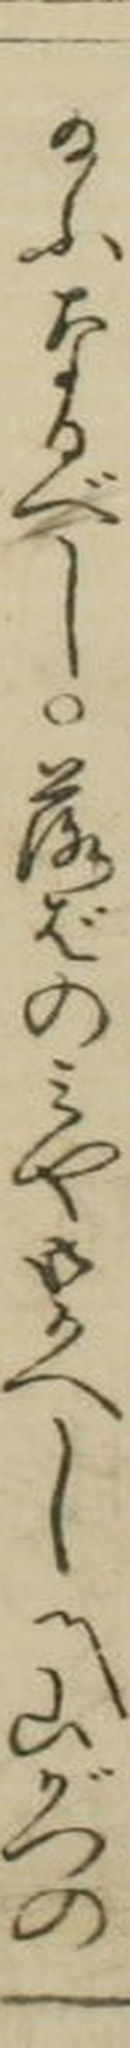給ふなるべし◯落ばのみや御かへし〽山がつの
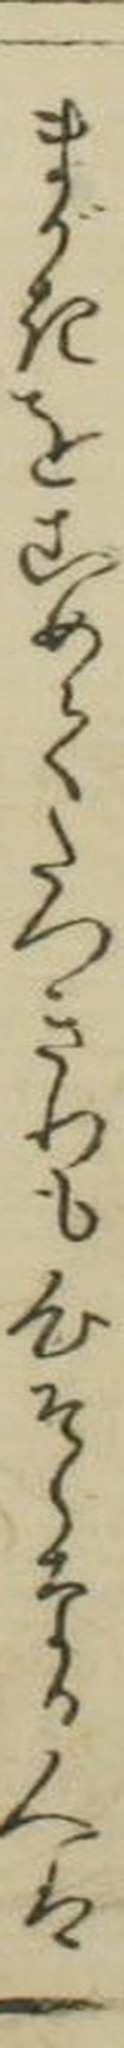まがきをこめてたつきりも心そらなる人は
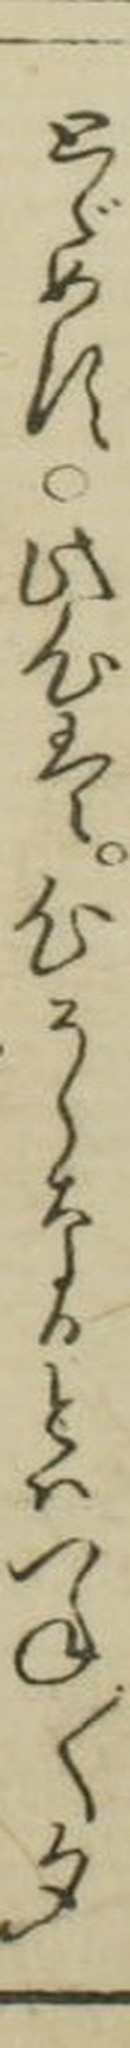とゞめす◯此心は。心そらなるとはつね〳〵夕
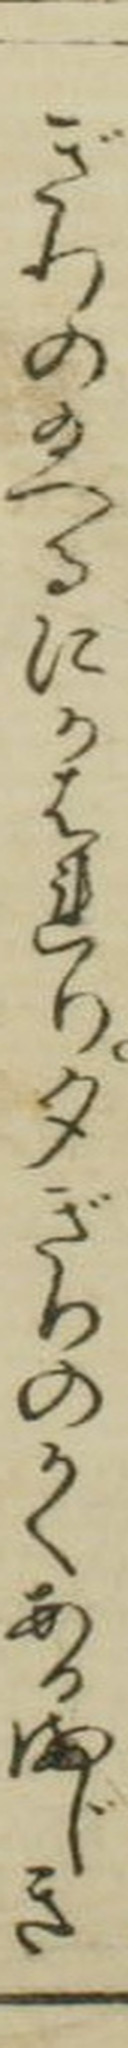ぎりの給へるにかはれり。夕ぎりのかくあるまじき
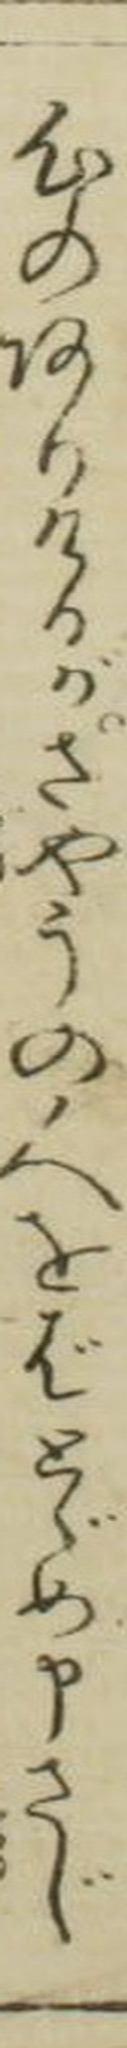心のありけるが。さやうの人をばとゞめ申さじ
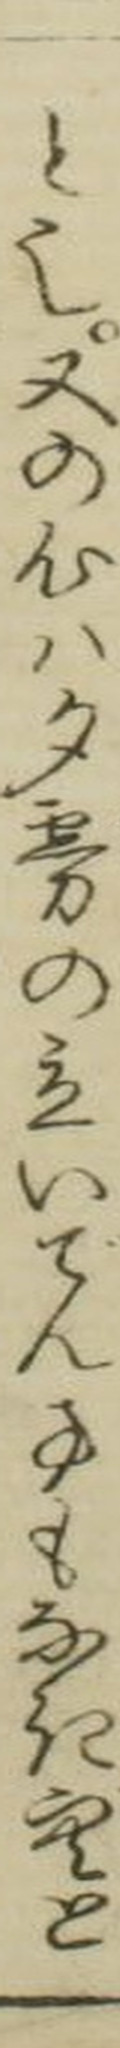と也。又の心は夕霧の立いでん事もなき空と
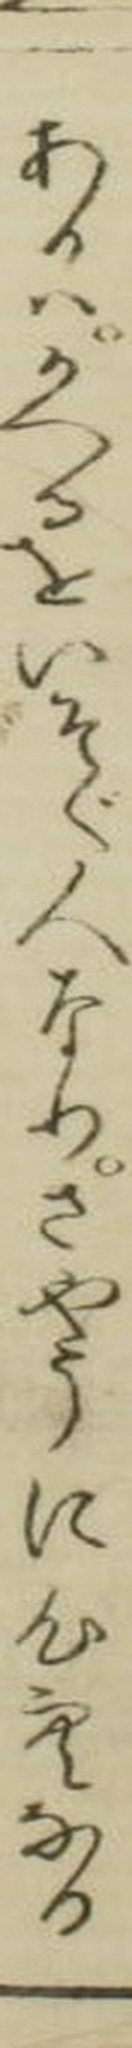あるは。かへるをいそぐ人なり。さやうに心空なる
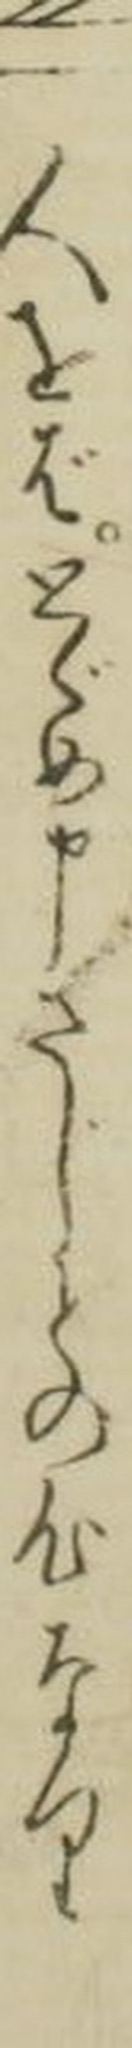人をば。とゞめ申さじとの心なり
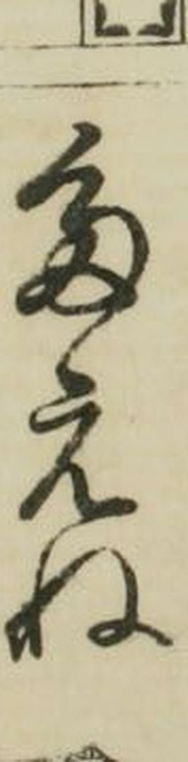たえぬ
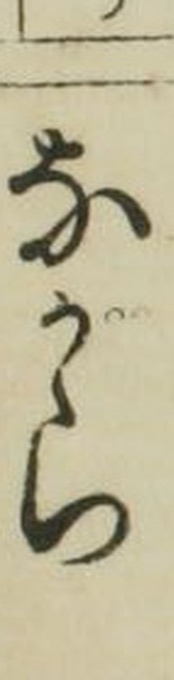ながら
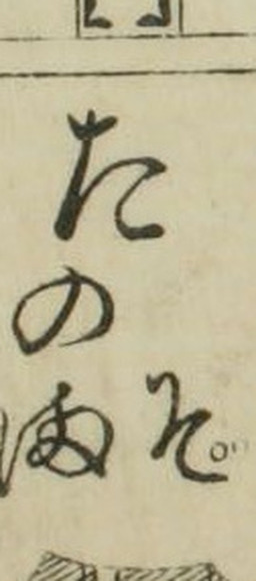たのま
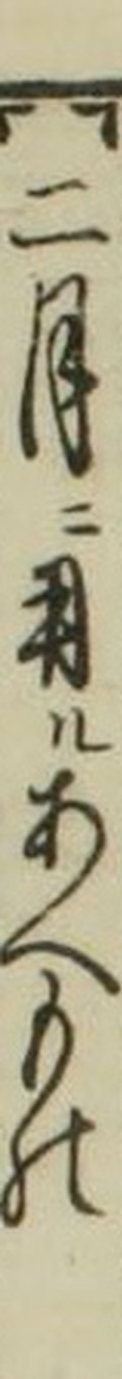二月用あへもの
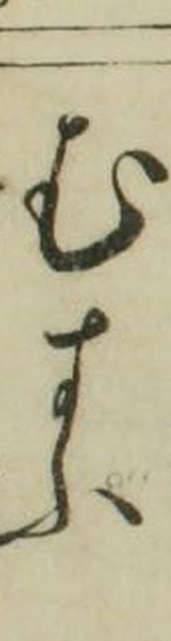むすぶ
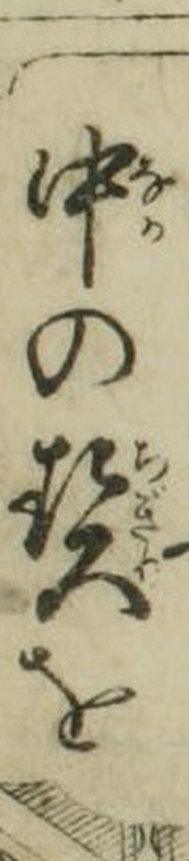中の契を

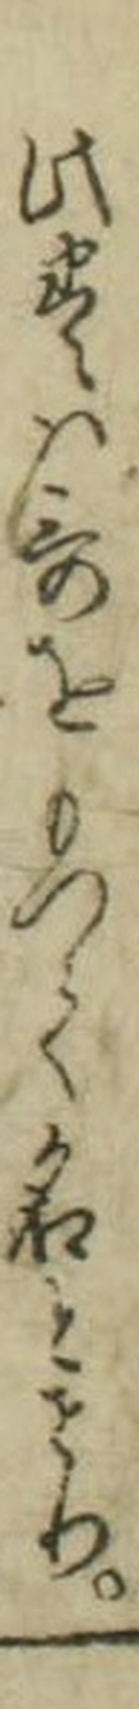此巻は哥をもつて名とせり。
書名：女源氏教訓鑑
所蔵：東京学芸大学附属図書館
